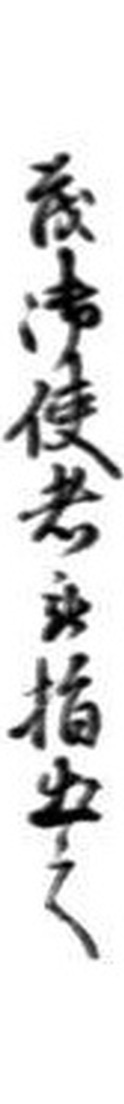茂御使者被指出之
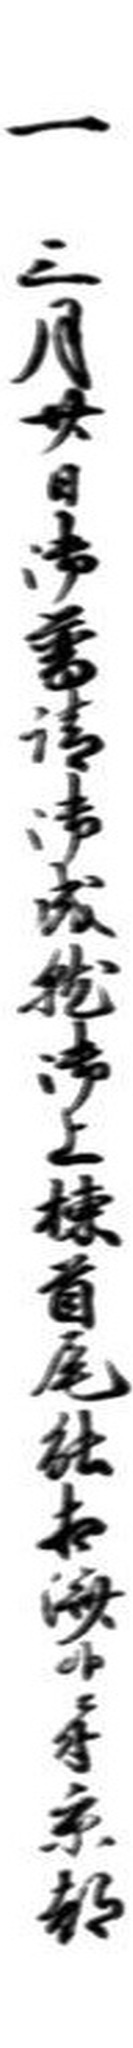一三月廿日御普請御成就御上棟首尾能相済候ニ付京都

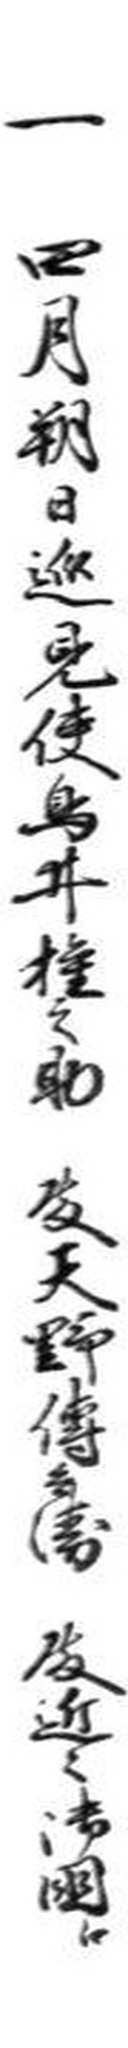一四月朔日巡見使鳥井権之助殿天野伝兵衛殿近々御国江
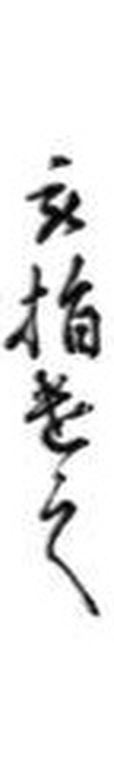被指遣之
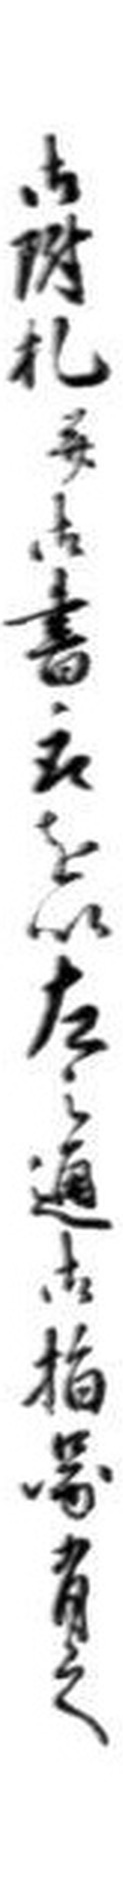御付札并御書取を以左之通御指図有之
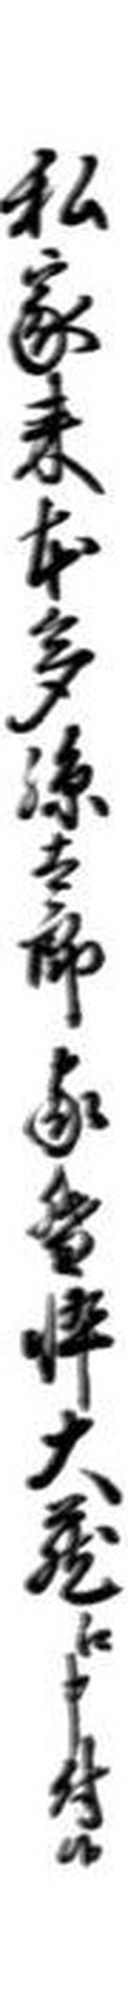私家来本多孫太郎家督忰大蔵江申付候
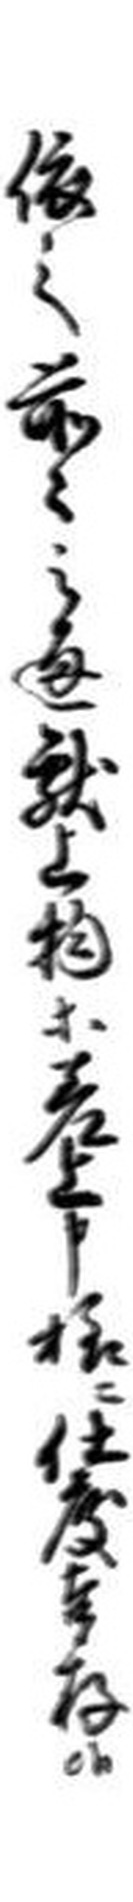依之前々之通献上物等差上申様ニ仕度奉存候
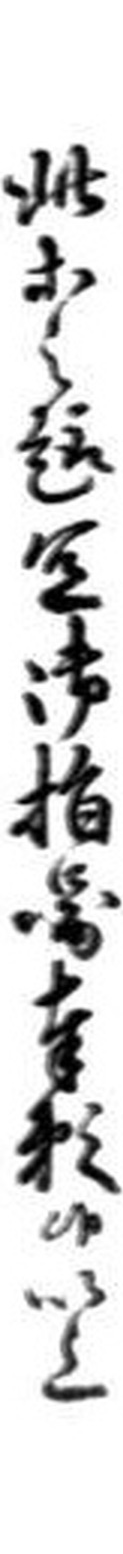此等之趣宜御指図奉願候以上
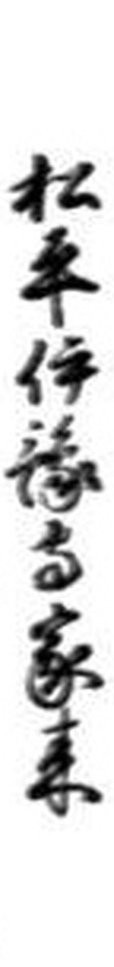松平伊予守家来
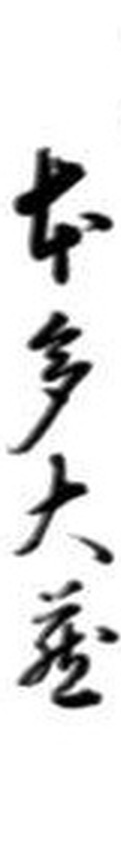本多大蔵
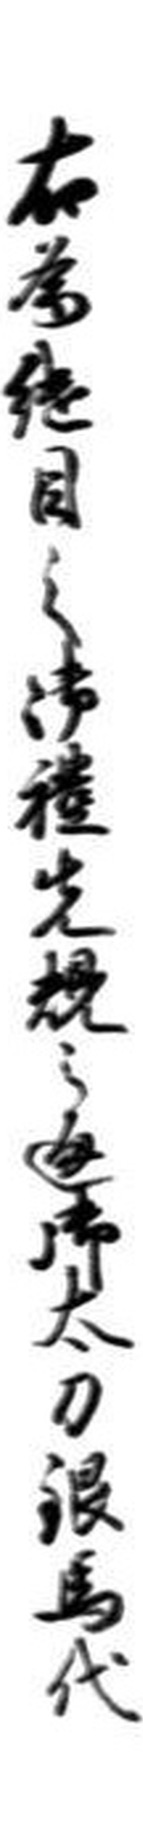右為継目之御礼先規之通御太刀銀馬代

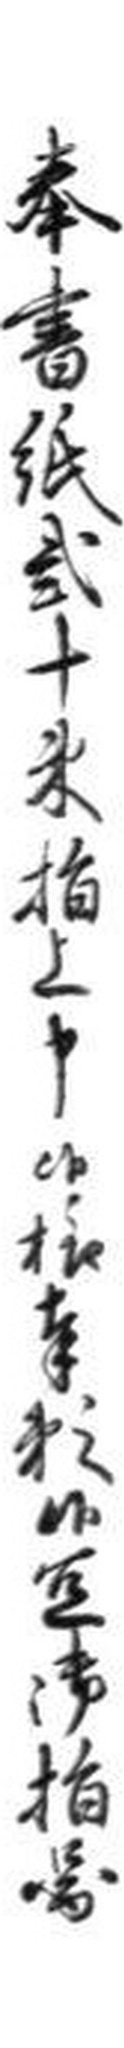奉書紙弐十束指上申候様奉願候宜御指図
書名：家譜 三十二 吉邦公 従享保二年到享保三年
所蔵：福井県文書館 Fukui Prefectural Archives
